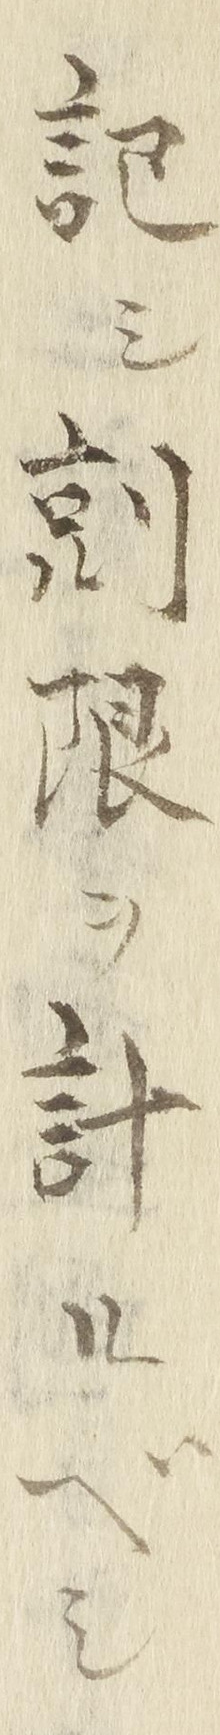記シ剋限ヲ計ルベシ
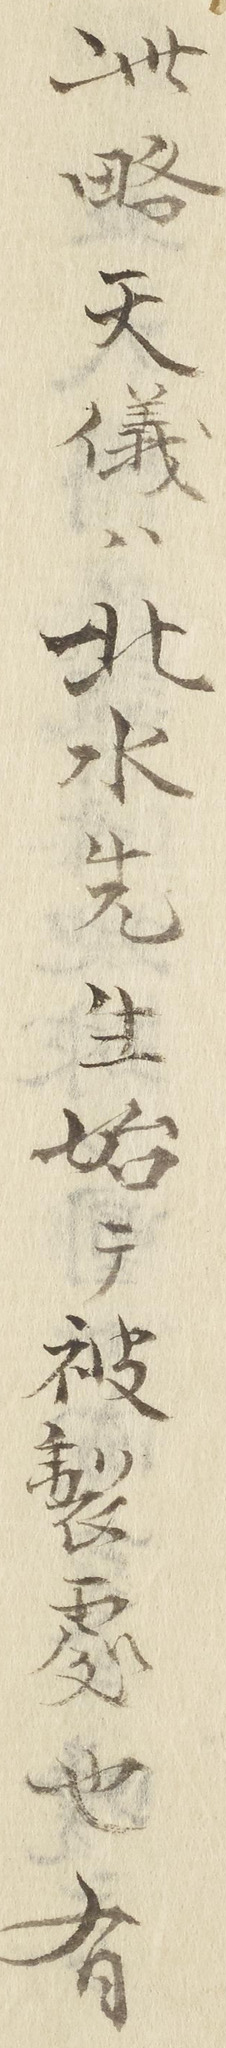此略天儀ハ北水先生始テ被製処也有
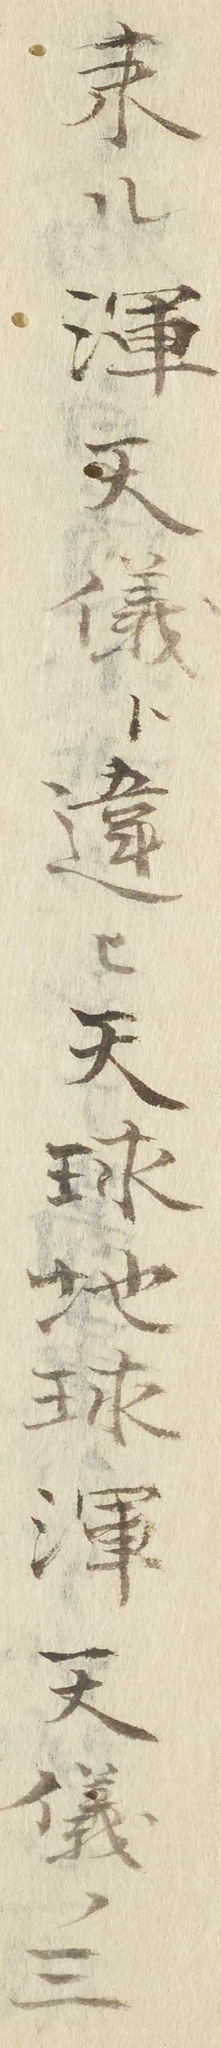来ル渾天儀ト違ヒ天球地球渾天儀ノ三
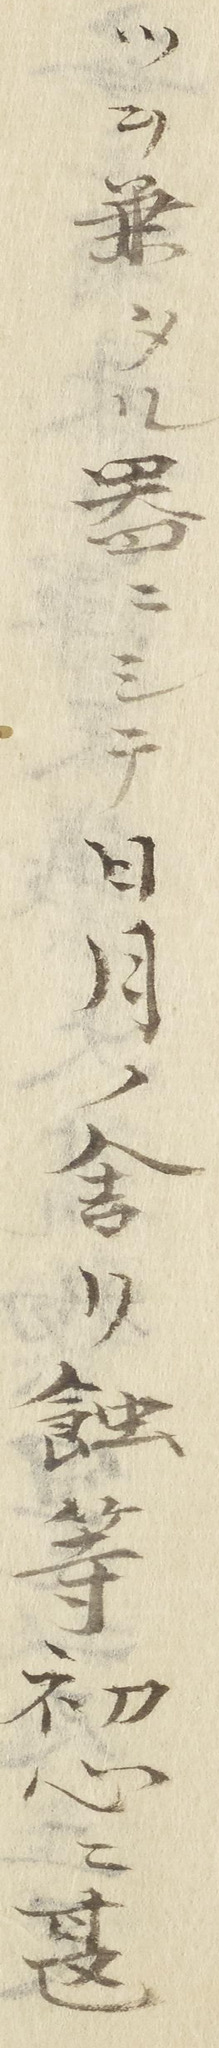ツヲ兼タル器ニシテ日月ノ舎リ蝕等初心ニ甚

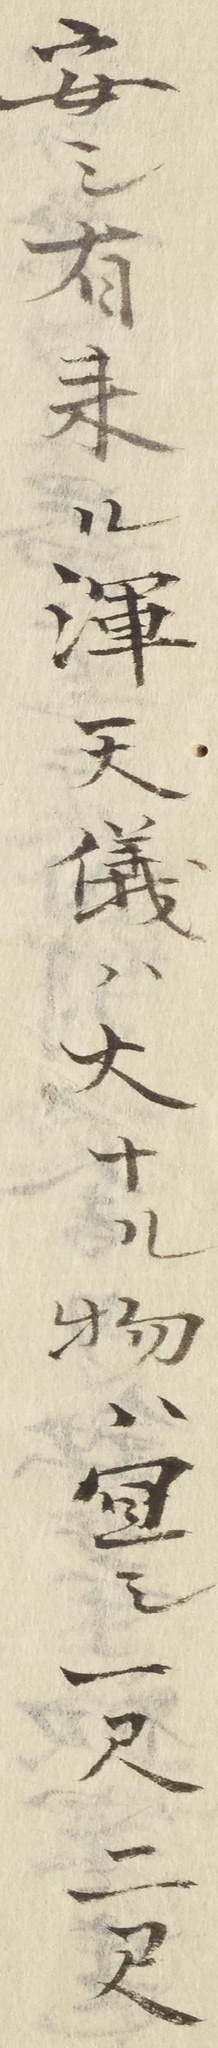安シ有来ル渾天儀ハ大ナル物ハ宣シ一尺二尺
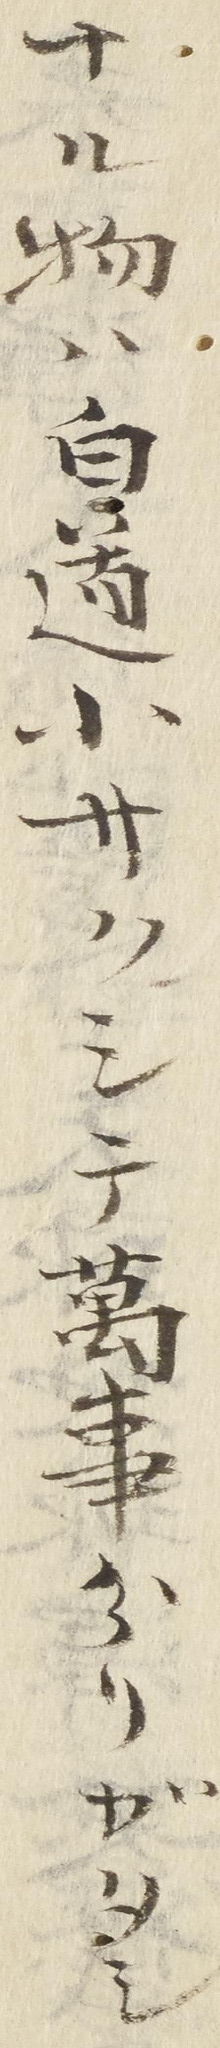ナル物ハ白道小サクシテ万事分リガタシ
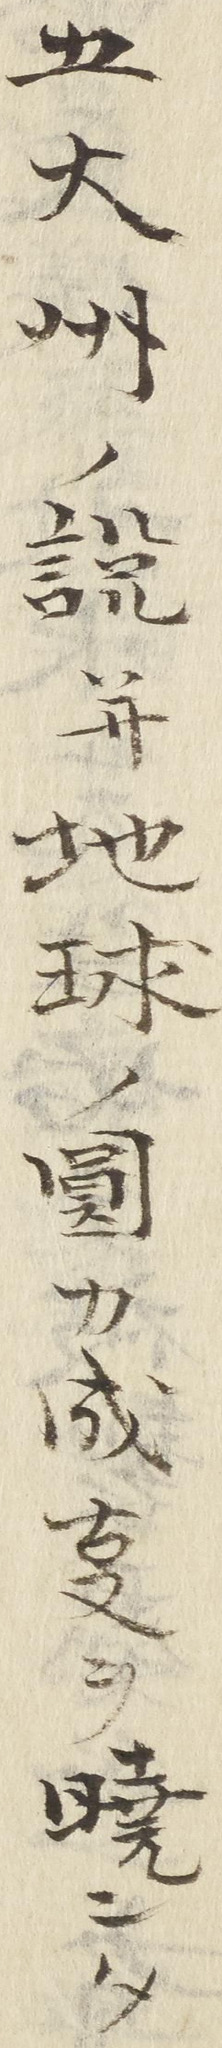五大州ノ説幷地球ノ図カ成事ヲ暁ニ夕
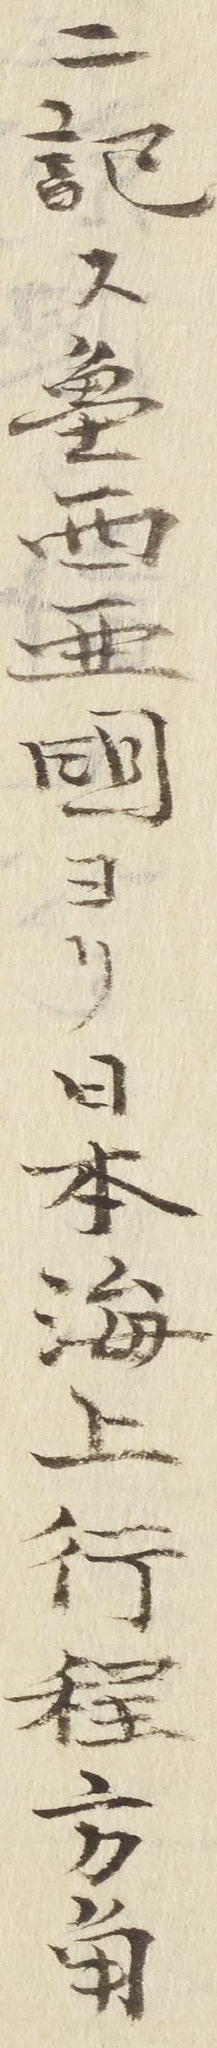ニ記ス魯西亜国ヨリ日本海上行程方角
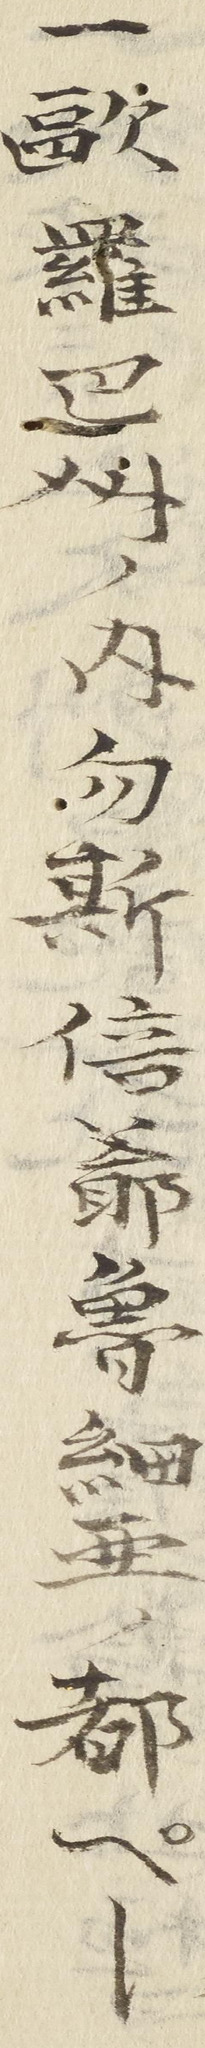一欧羅巴州ノ内勿斯倍爺魯細亜ノ都ぺー
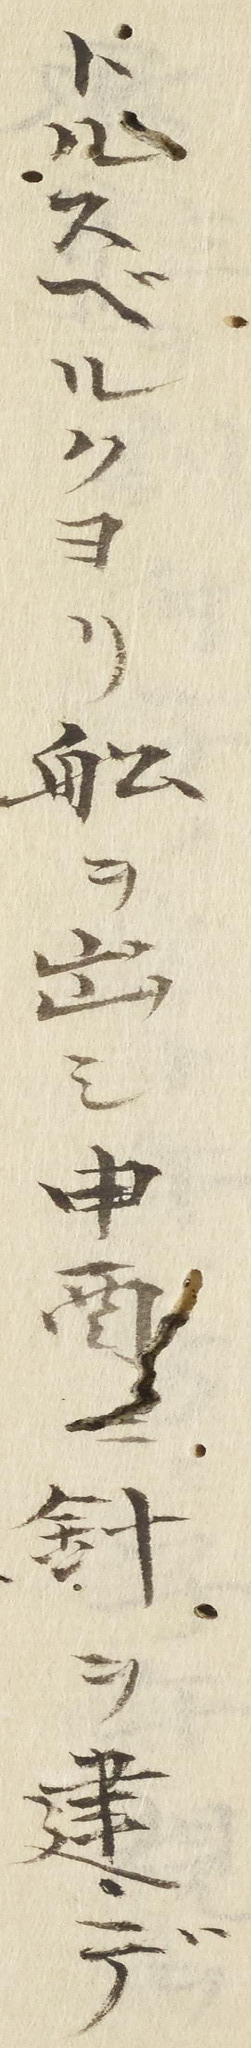ドルスベルクヨリ船ヲ出シ申酉ニ針ヲ建デ
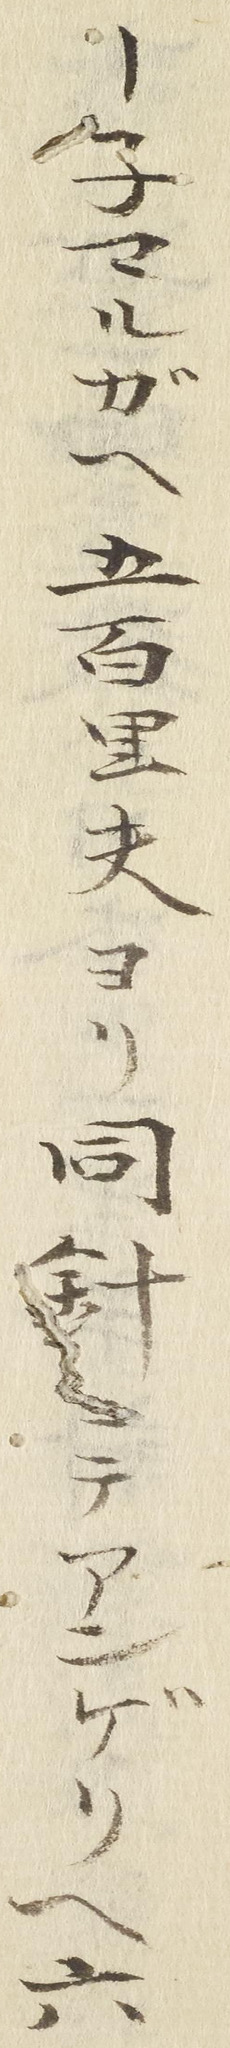ーネマルガヘ五百里夫ヨリ同針ニテアンゲリヘ六
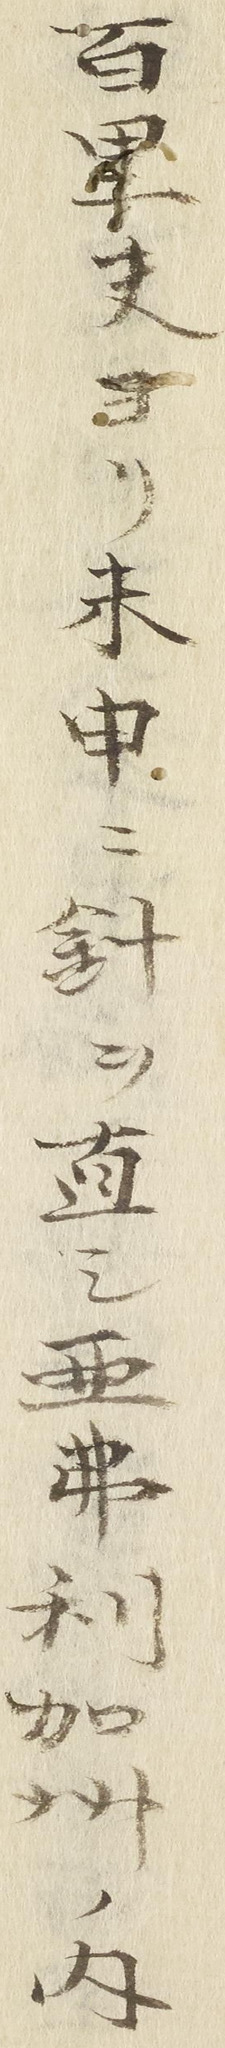百里夫ヨリ未申ニ針ヲ直シ亜弗利加州ノ内
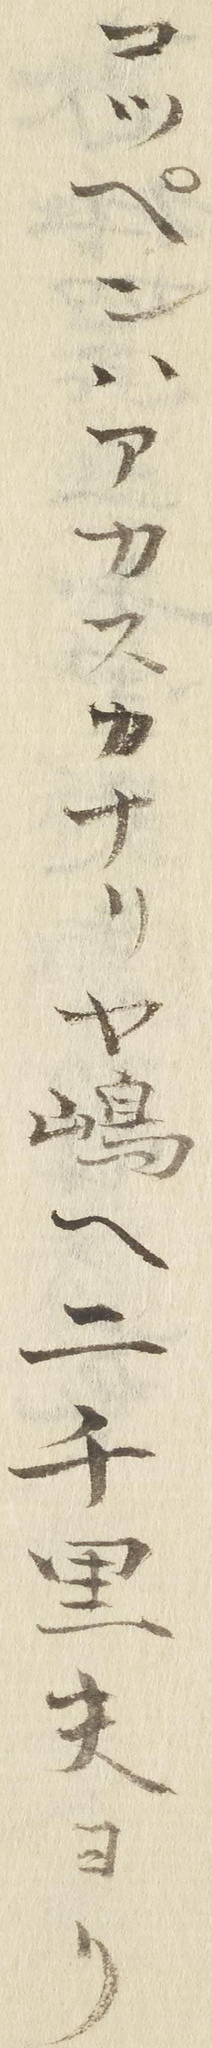コッペンハアカスカナリヤ島ヘ二千里夫ヨリ
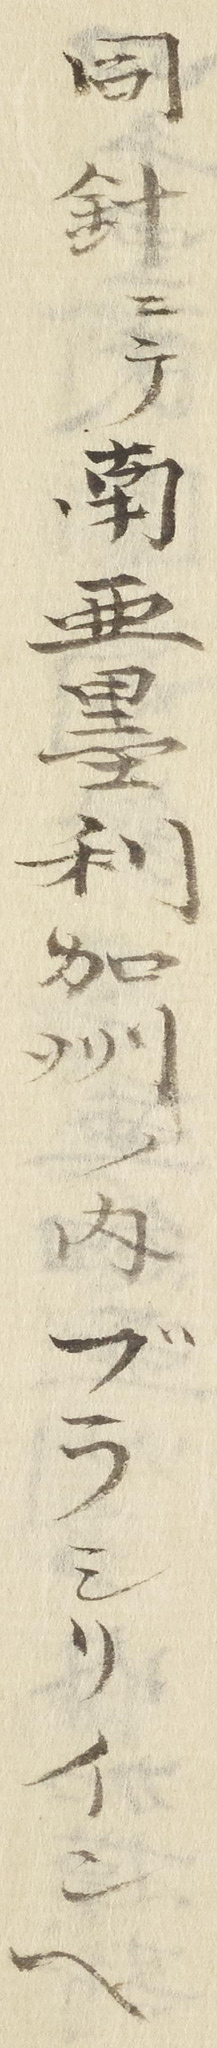同針ニテ南亜墨利加州ノ内ブラシルインヘ
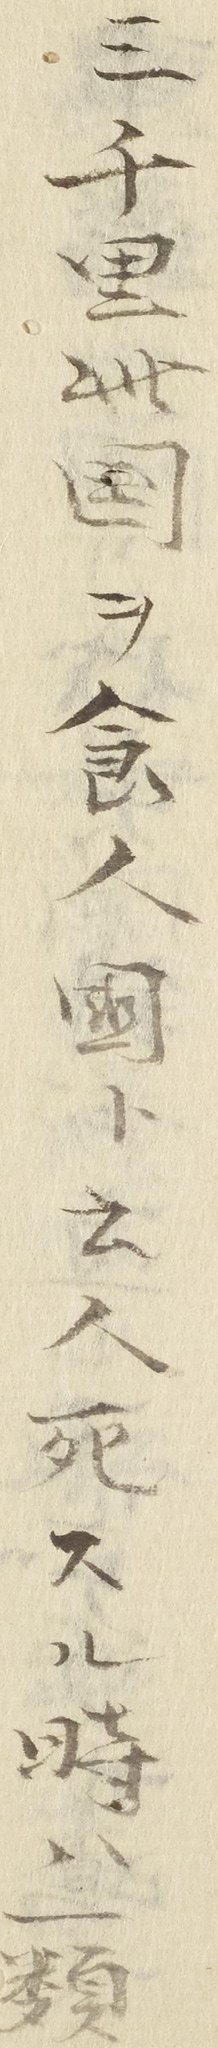三千里此国ヲ食人国ト云人死スル時ハ一類
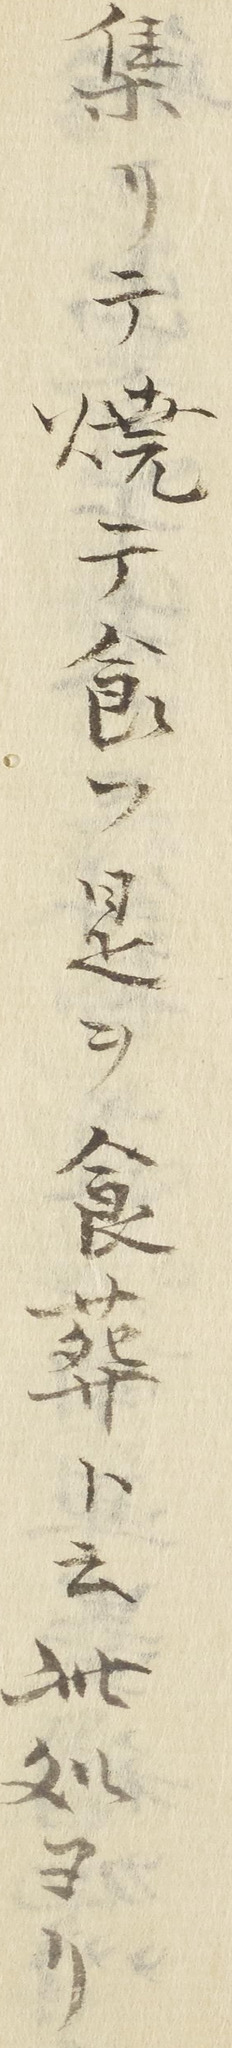集リテ焼テ食フ是ヲ食葬ト云此処ヨリ
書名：天象話説
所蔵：東京大学地震研究所図書室 Earthquake Research Institute Library, The University of Tokyo, JAPAN
